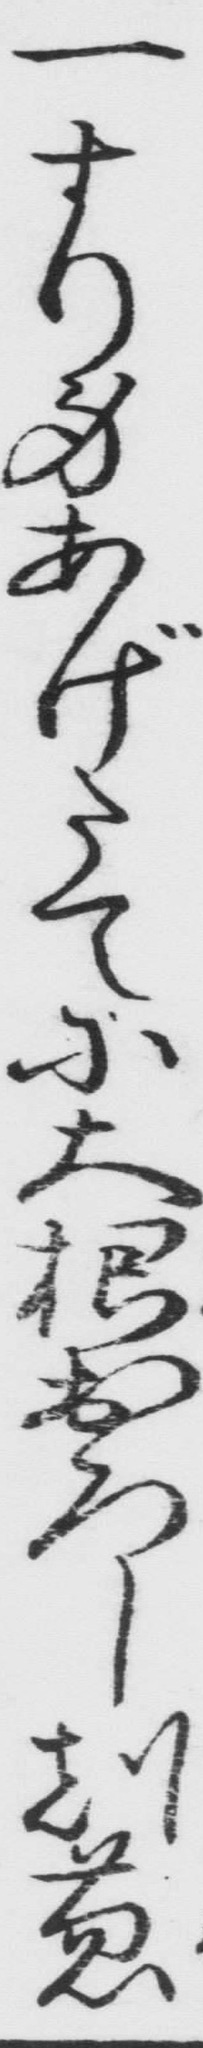一すり身あげたてに大根おろし刻葱
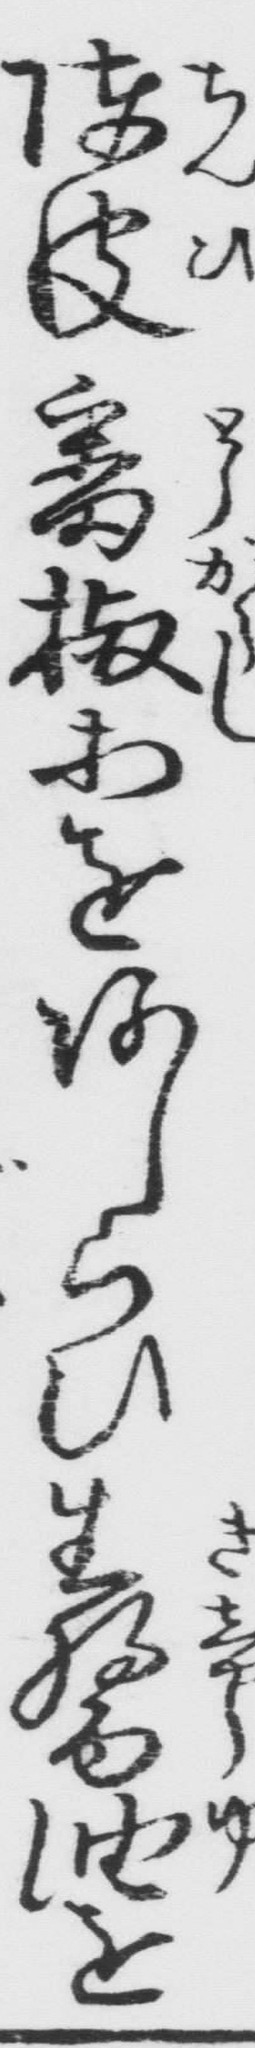陳皮蕃椒等をあしらひ生醤油を
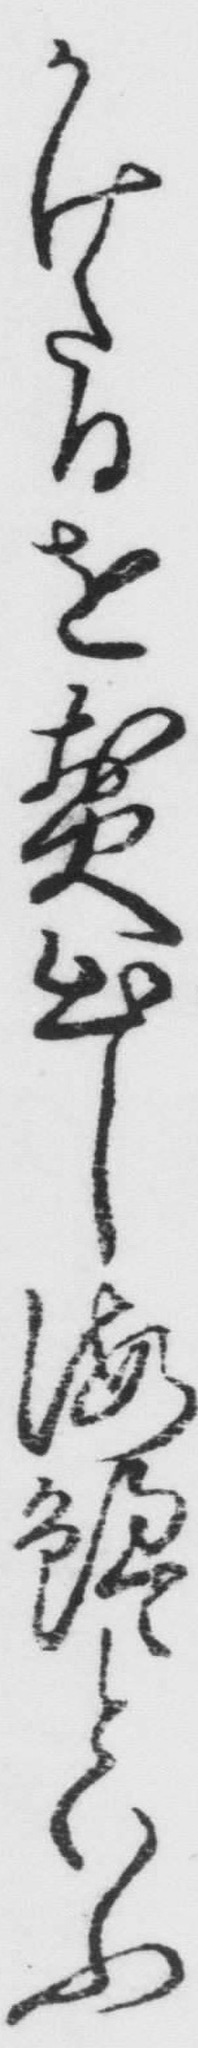かけたるを煎出し海鱧といふ
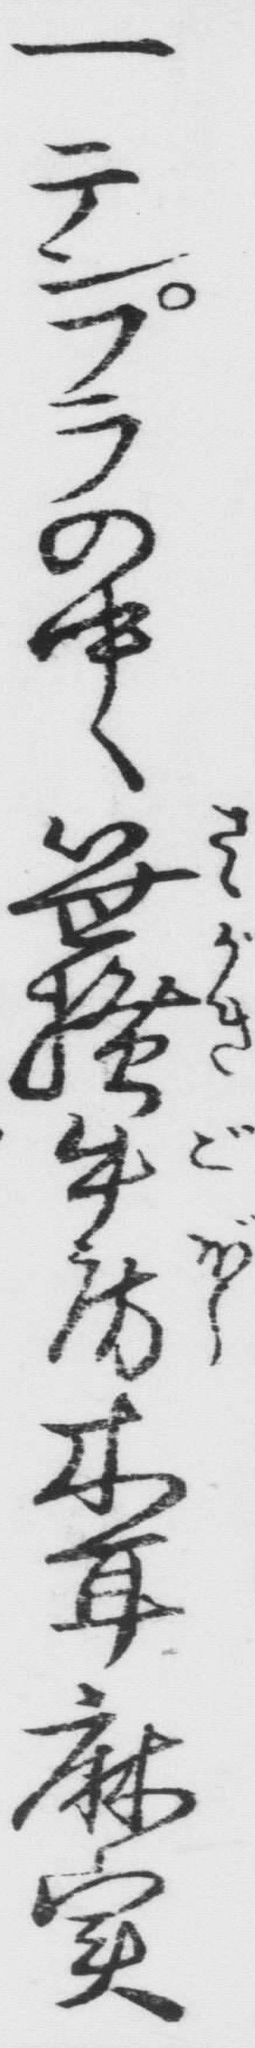一テンプラの中へ笹掻牛房木耳麻実
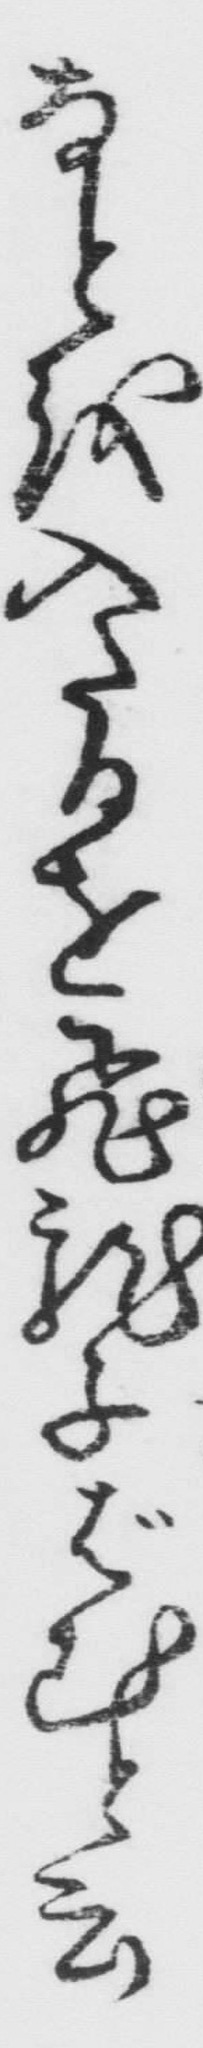なとを入たるを飛龍子ばむと云

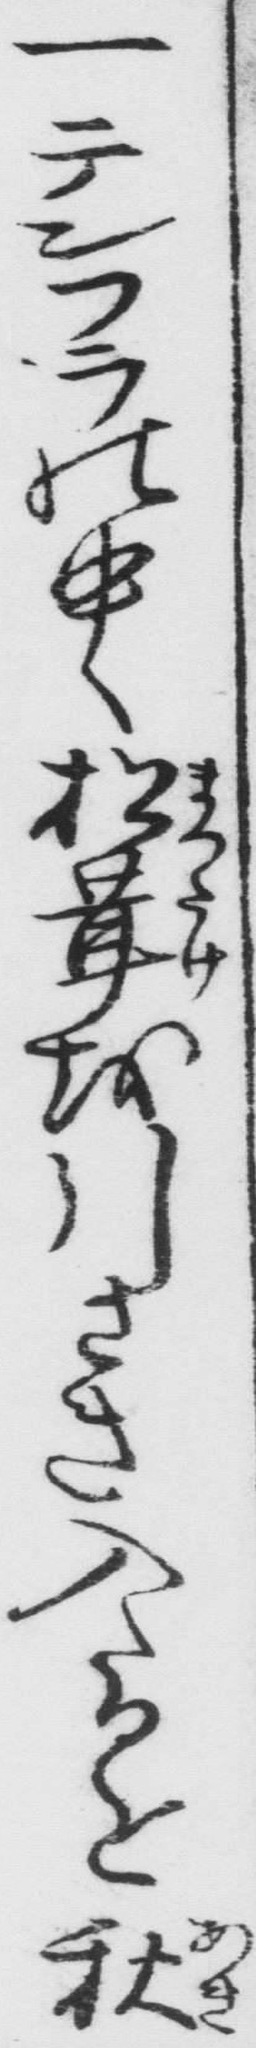一テンフラの中へ松茸を引さき入たるを秋
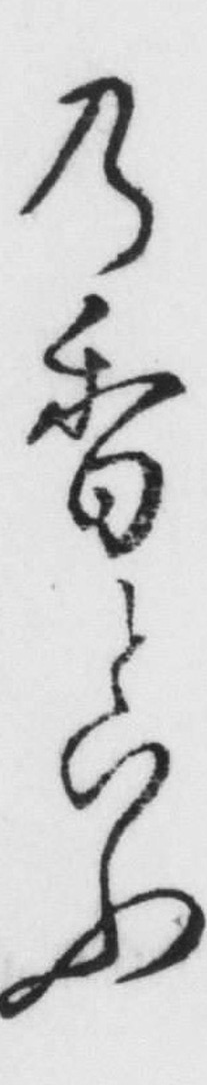の香といふ
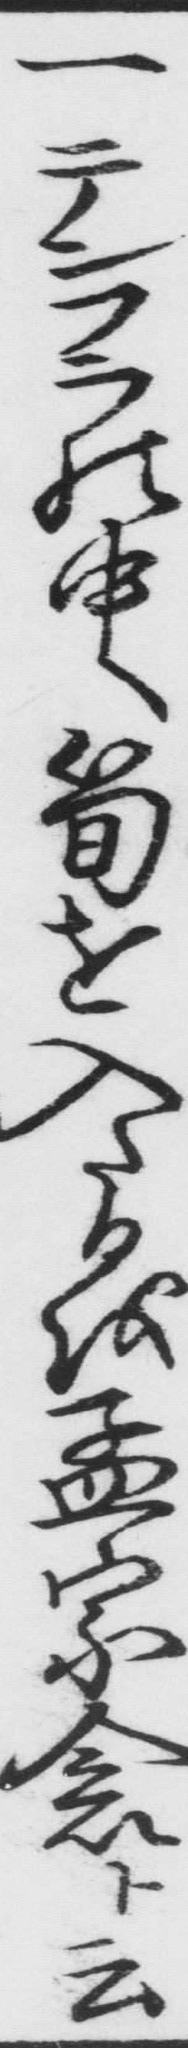一テンフラの中へ筍を入たるを孟宗衾と云
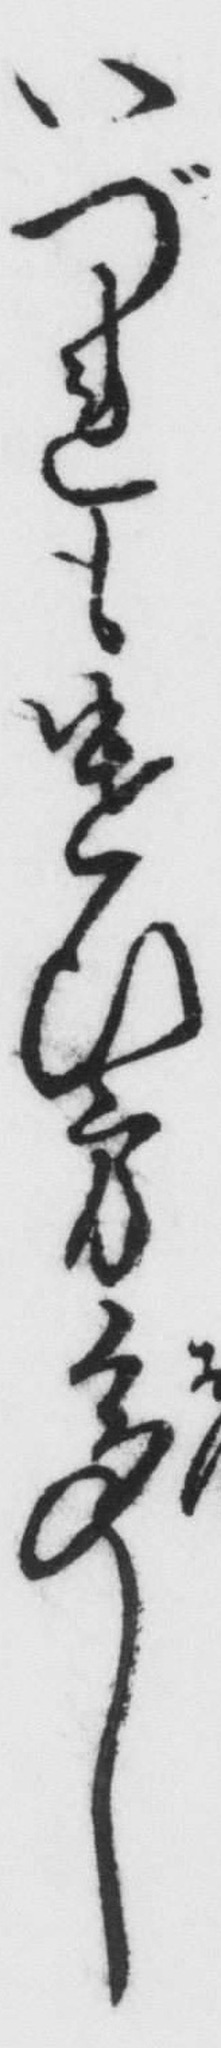いづれも遣ひ方多し
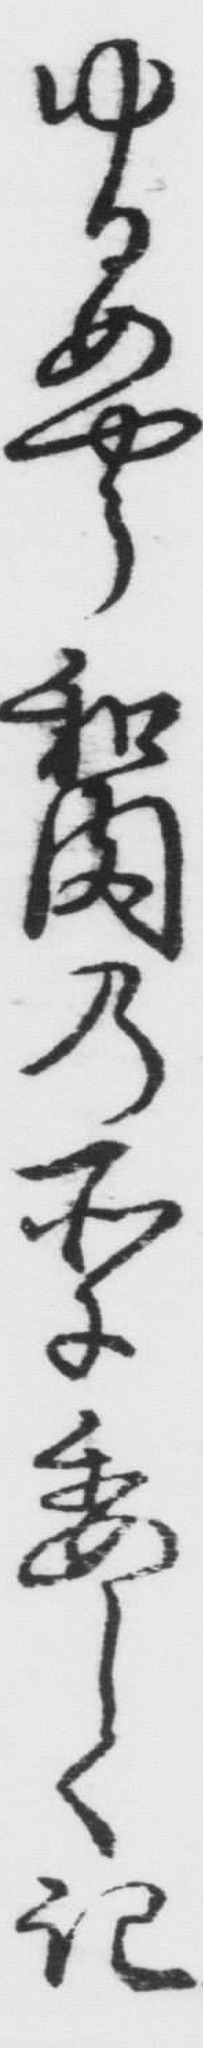ゆるめやう和肉の所に委しく記
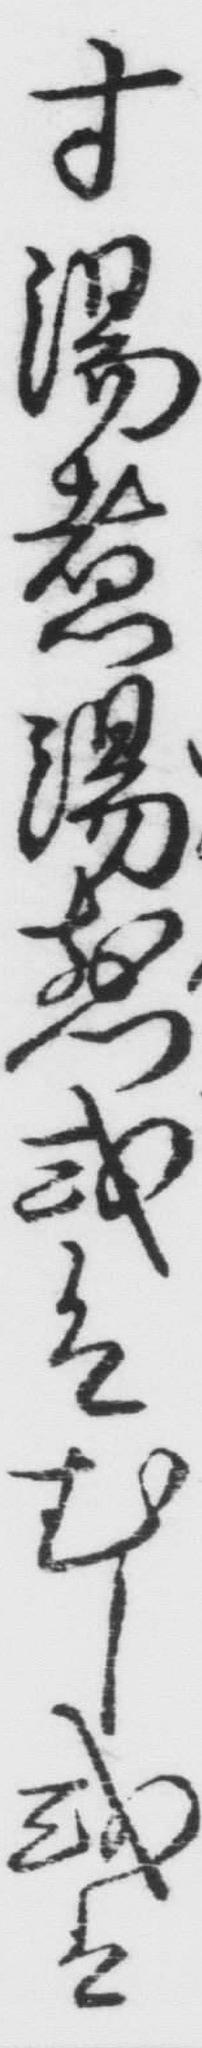す湯煮湯煎或はむし或は
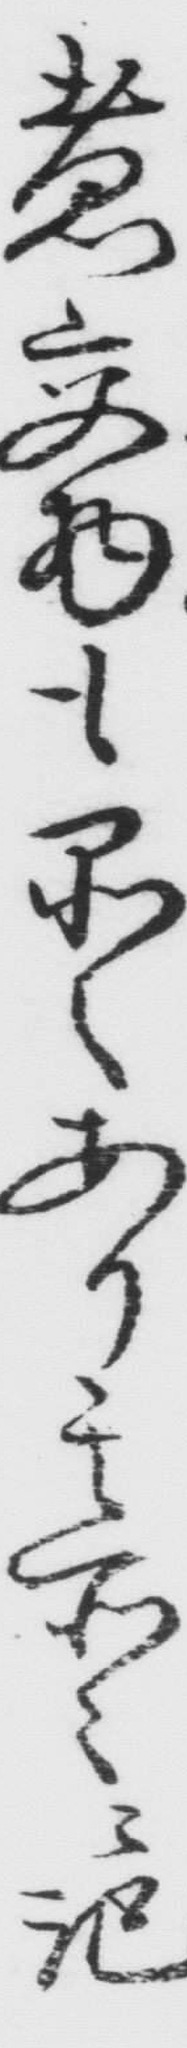煮交物も品々あり其所々に記
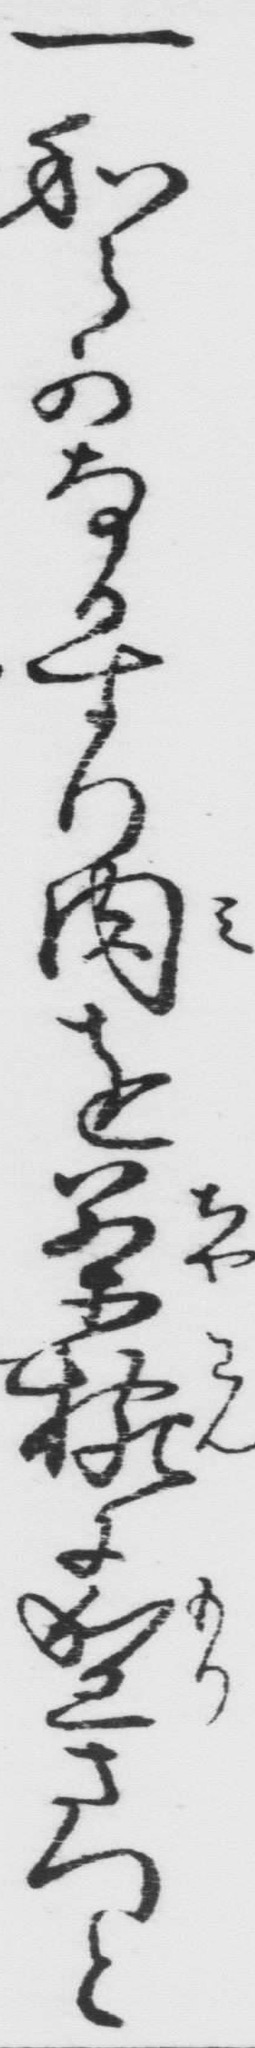一和らかなるすり肉を茶椀に盛さつと
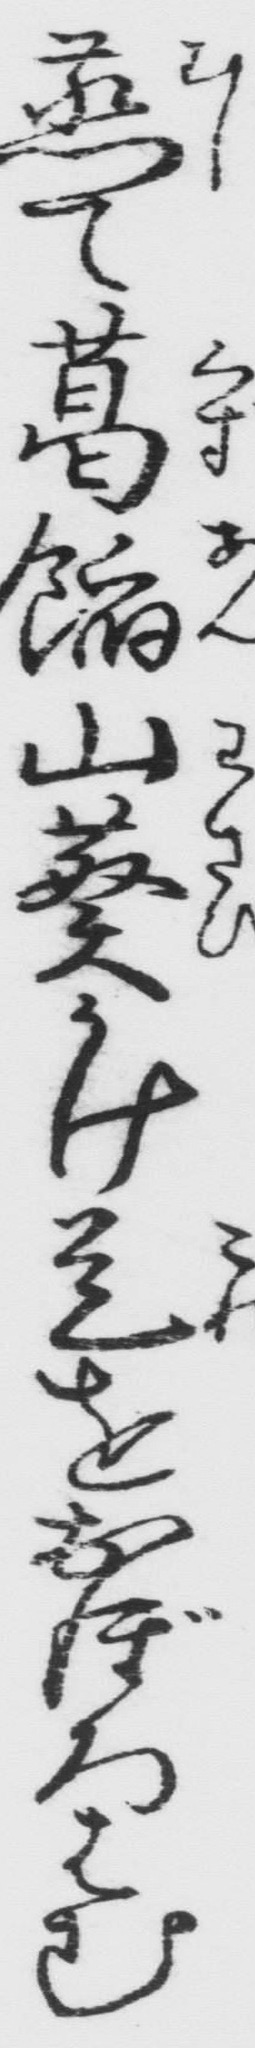蒸て葛餡山葵かけ是をおぼろはむ
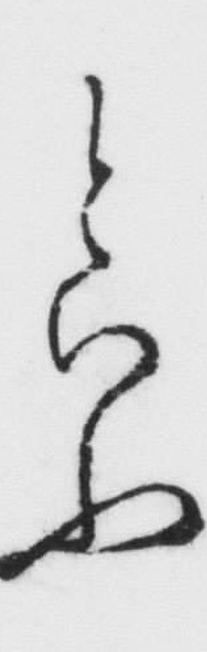といふ

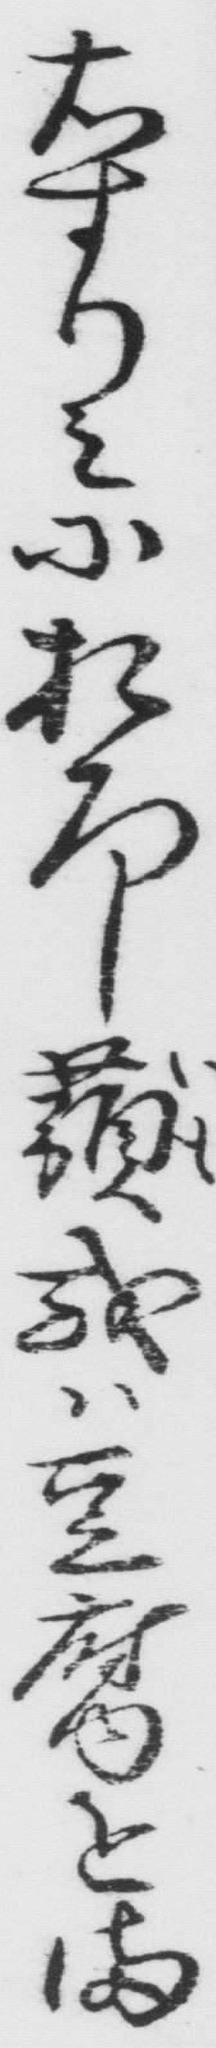右すりみにおろし藷或は豆腐をま
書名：海鰻百珍
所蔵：大阪府立大学学術情報センター 国文学研究資料館
